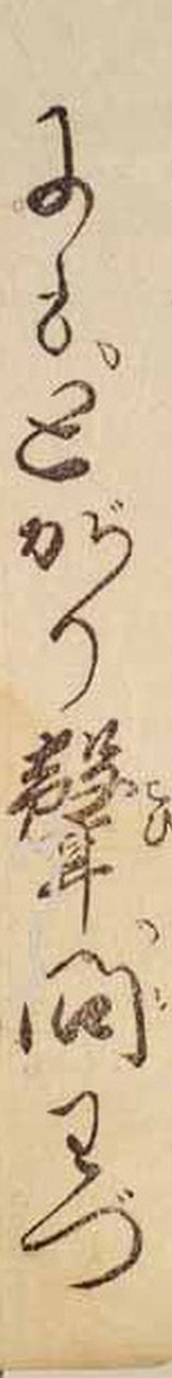にも。とがり声問わづ
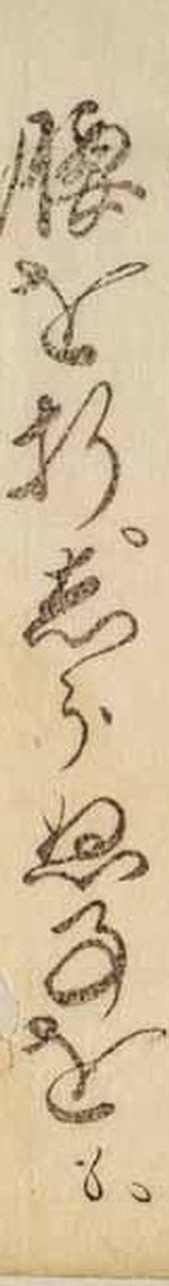腰を折。しらぬ事をも。
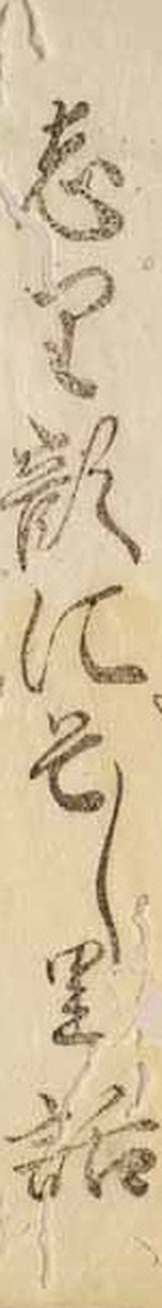しり顔に。そしり話
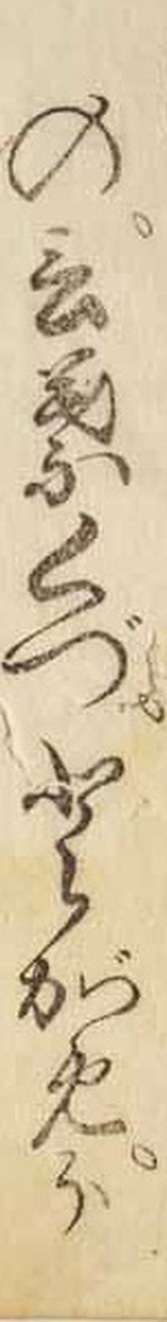の。言葉くづ。とがめ。ら

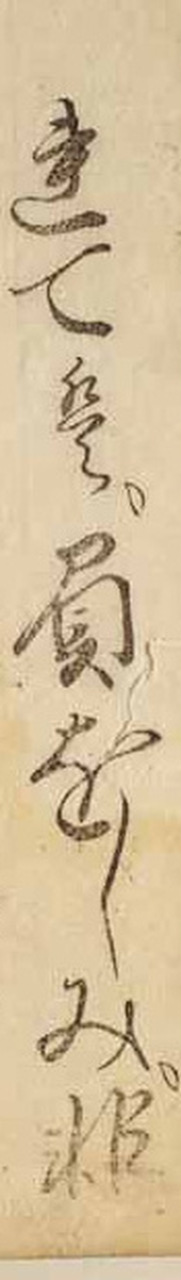れては。負をしみ。非
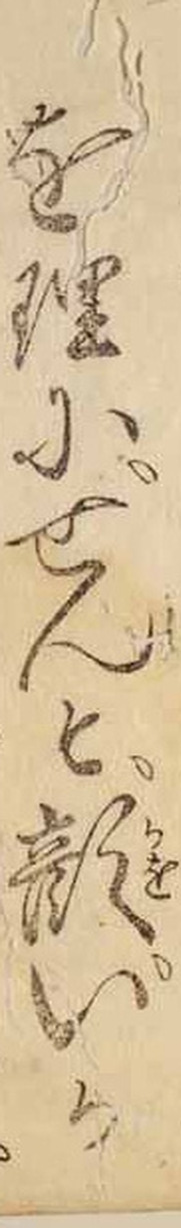を理に。せんと。顔。いか
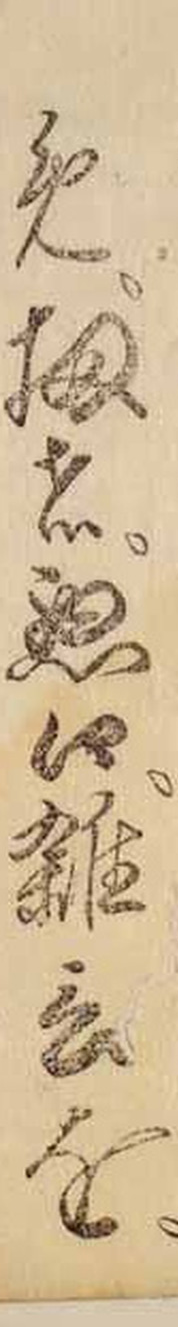め。扨者。悪口。雑言を。
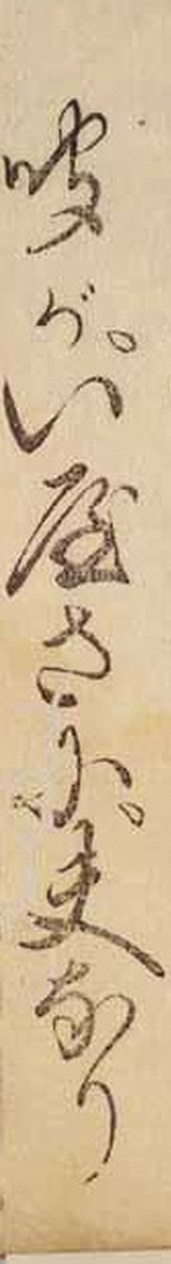聞が。いやさに。夫なり
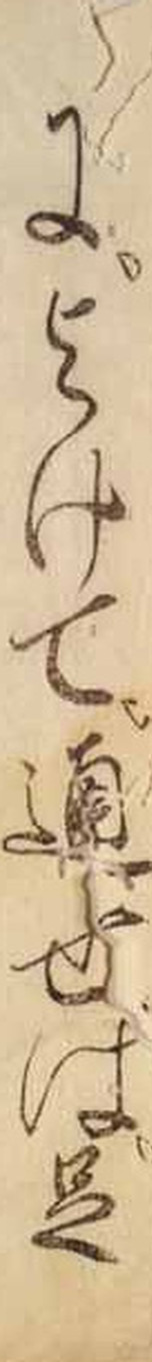に。よけて。通せば。足
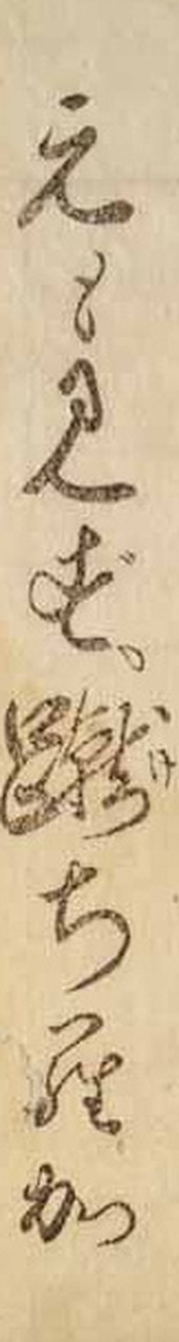元も見す。蹴ちらか
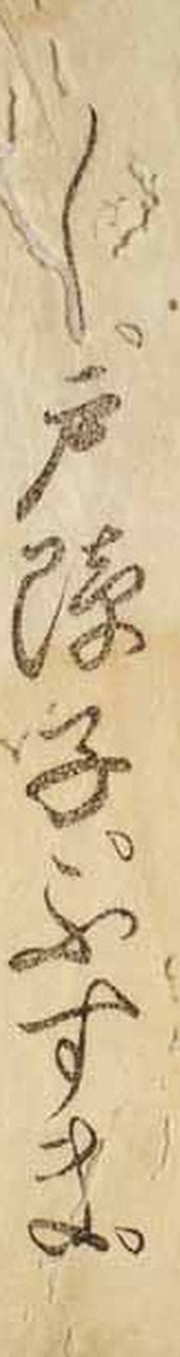し。戸障子。ふすま。
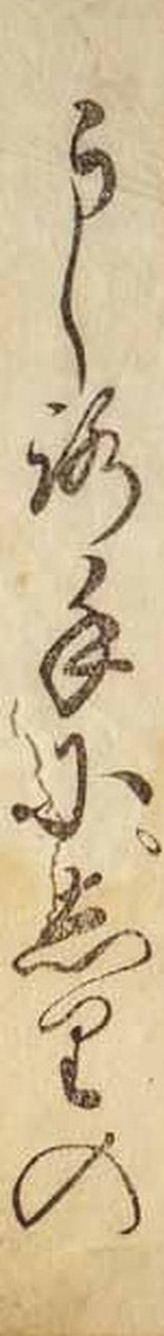うしろ手にしりの

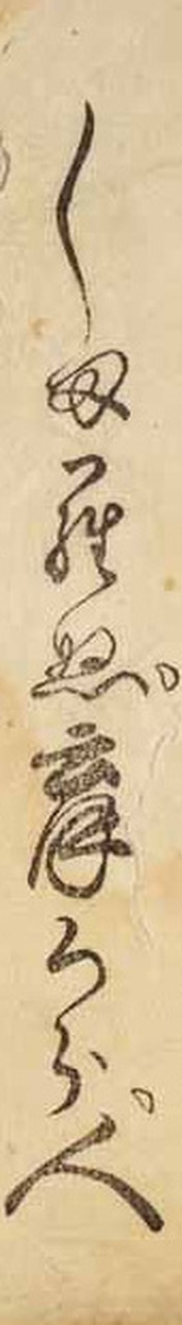しまらぬ。育から。人
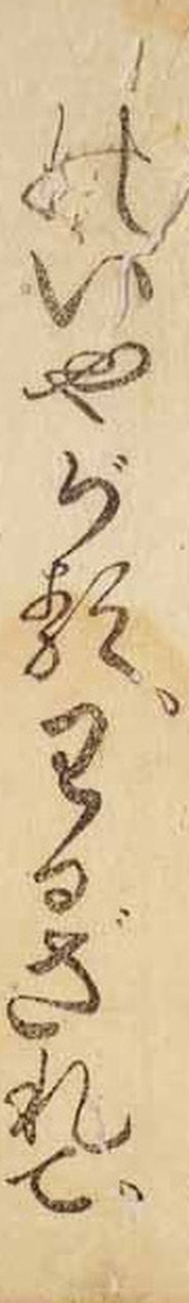のいやがる。わるざれて。
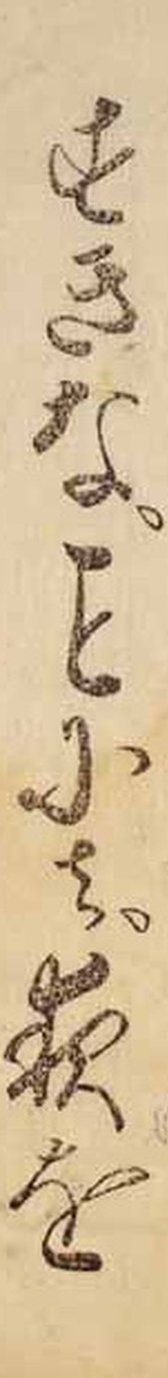すきな。ことには。夜を
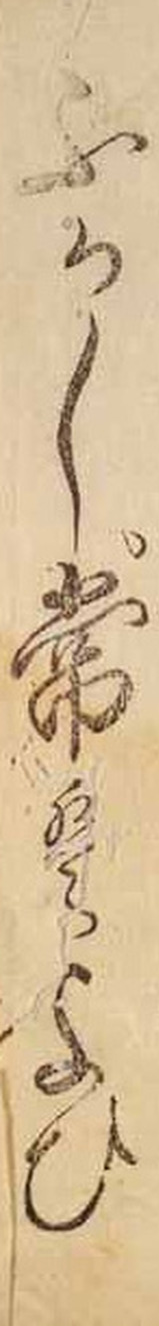ふかし。常はよひ
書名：寺子躾方
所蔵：東京学芸大学教育コンテンツアーカイブ
